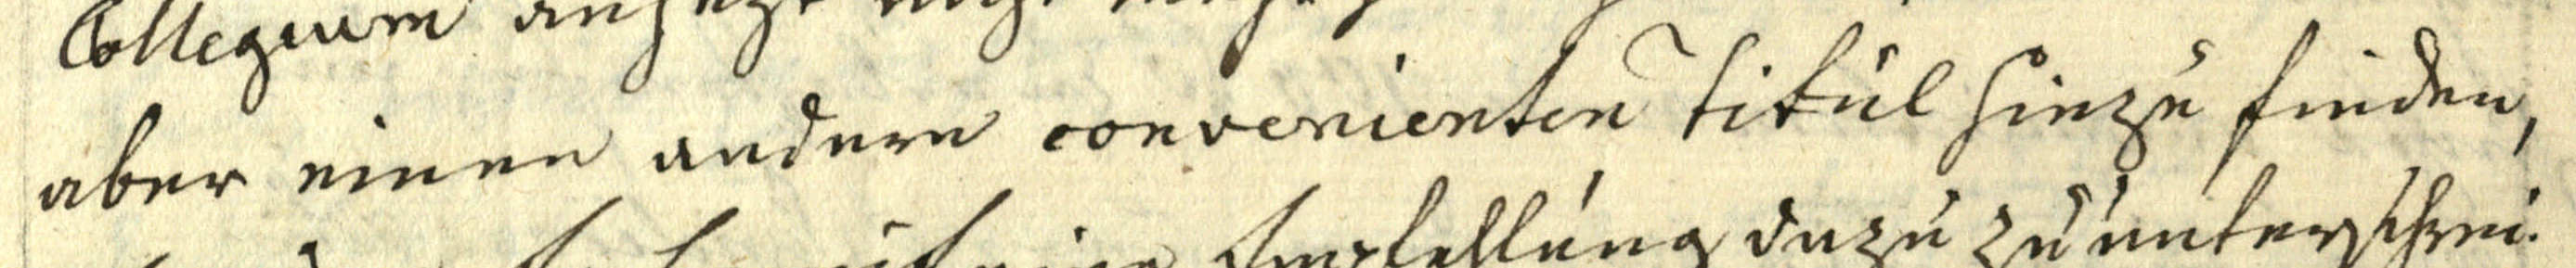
aber einen andern convenienten Titul hiezu finden,
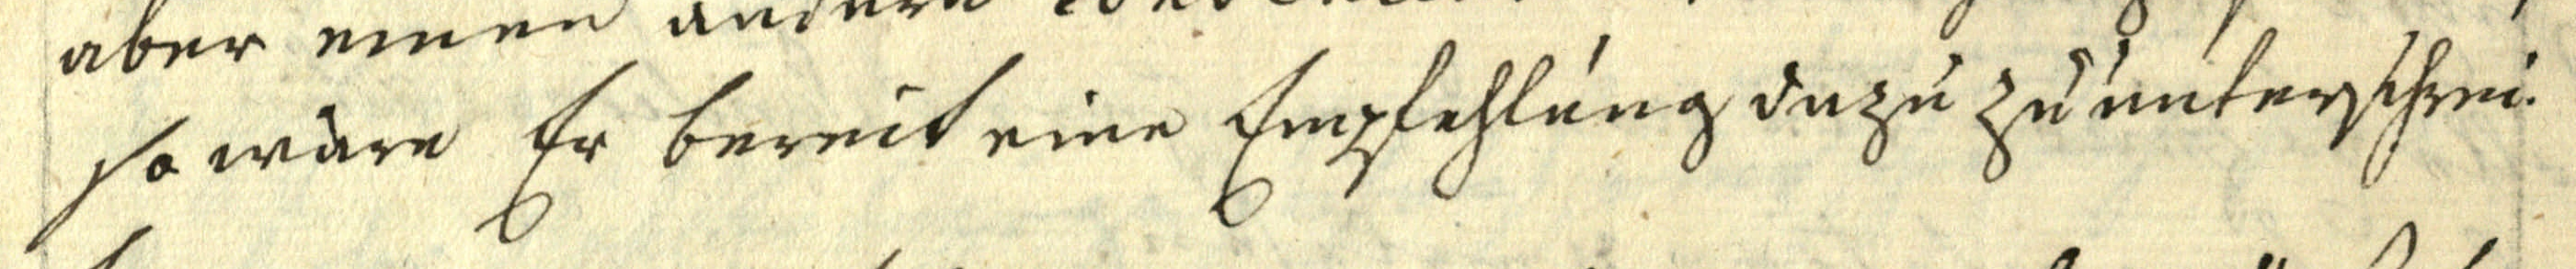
so wäre Er bereit eine Empfehlung dazu zu unterschrei¬
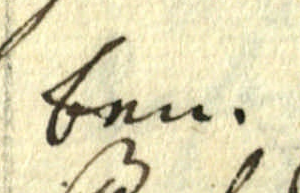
ben.
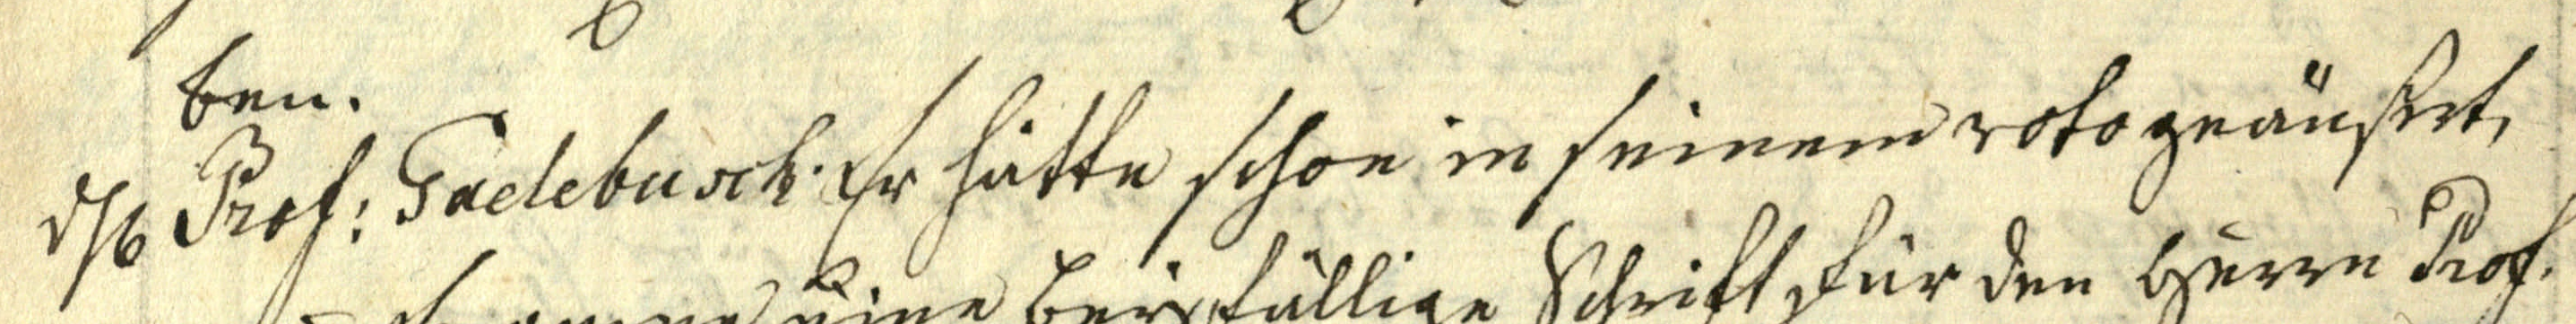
dh Prof. Gadebusch. Er hätte schon in seinem voto geäußert,
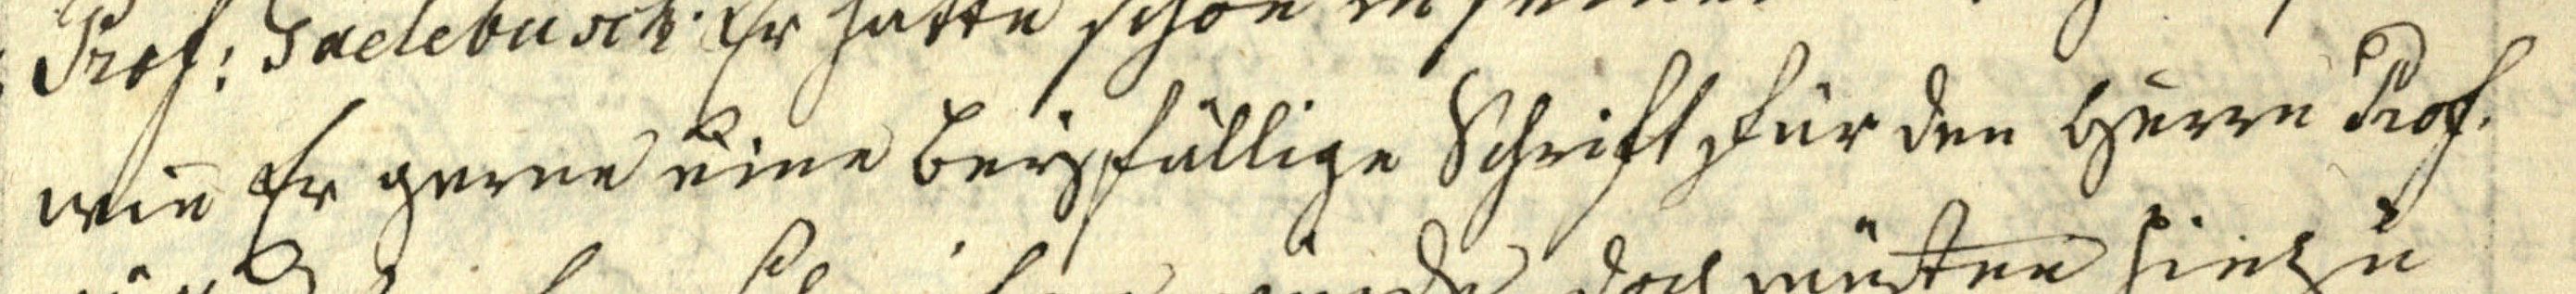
wie Er gerne eine beÿfällige Schrift für de Herrn Prof.
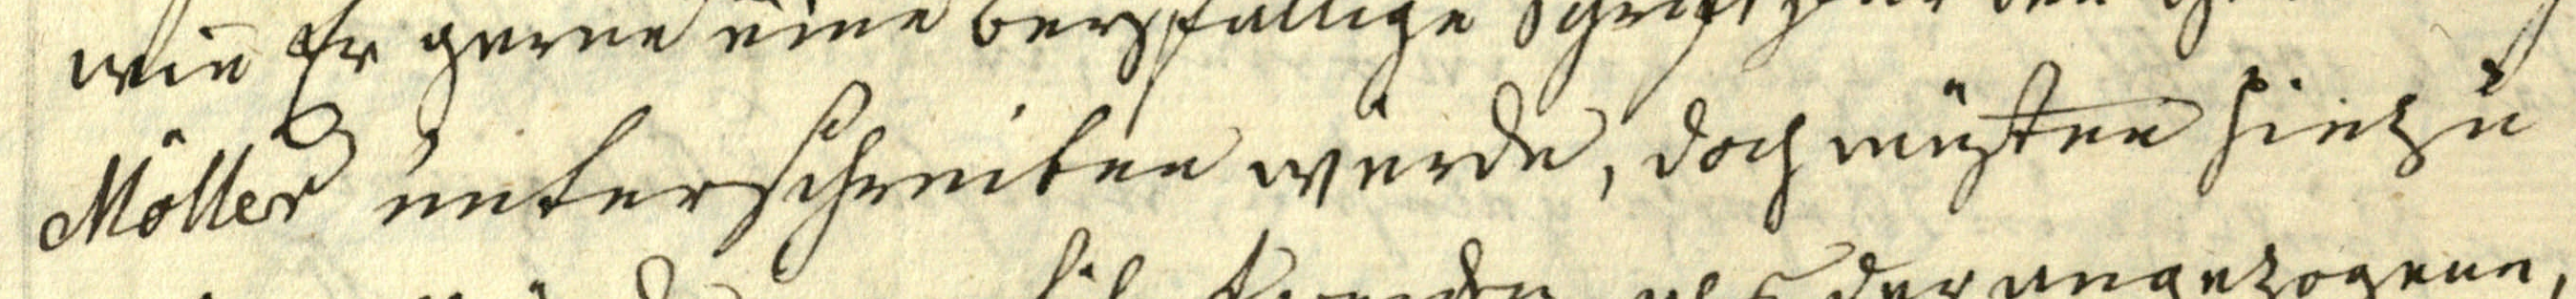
Möller unterschreiben würde, doch müsten hiezu
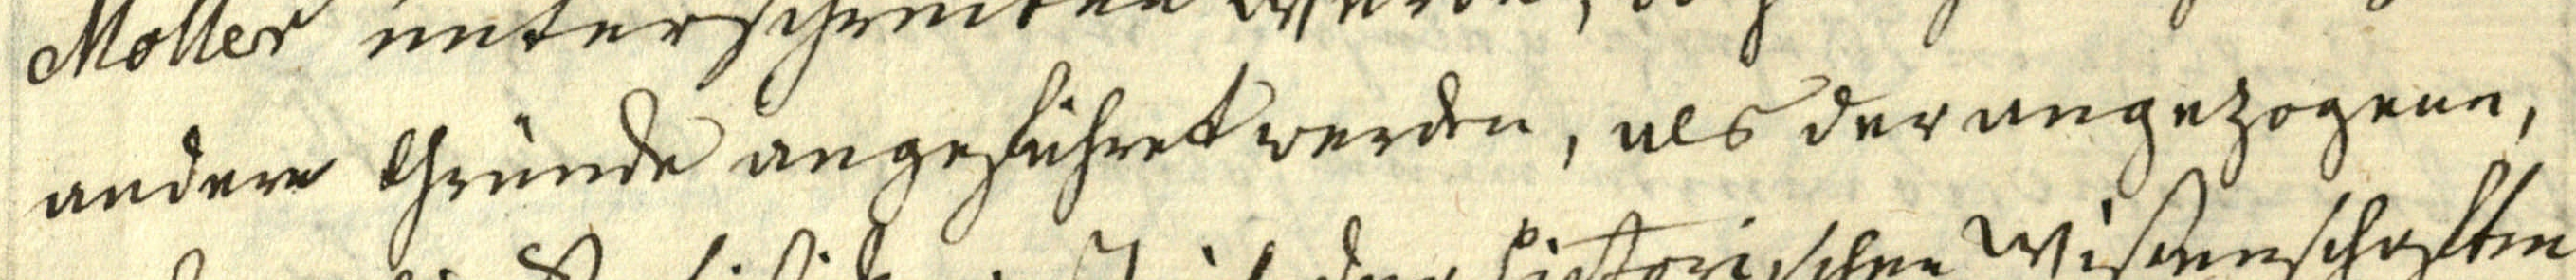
andere Gründe angeführet werden, als der angezogene,
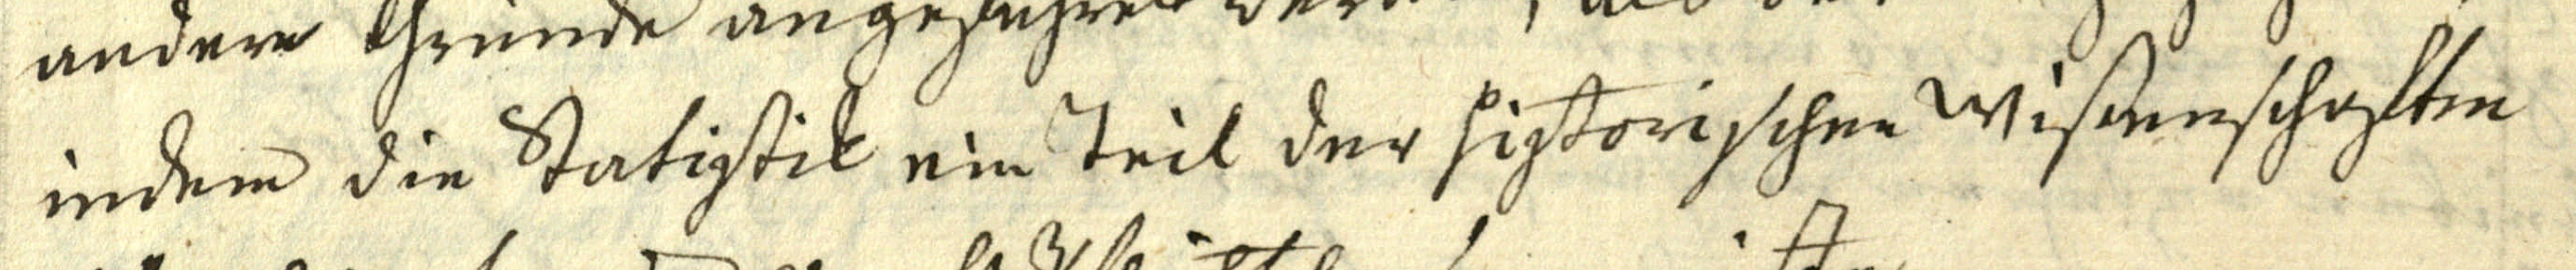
indem die Statistik ein Teil der historischen Wißenschaften
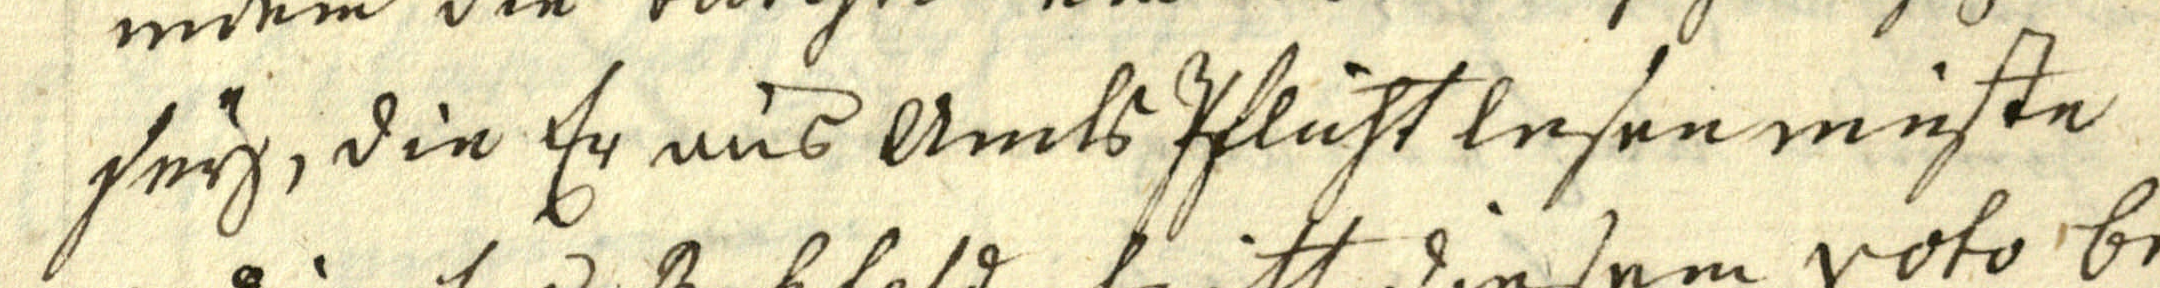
seÿ, die Er aus Amts Pflicht lesen müste
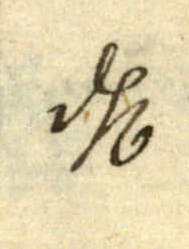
dh
